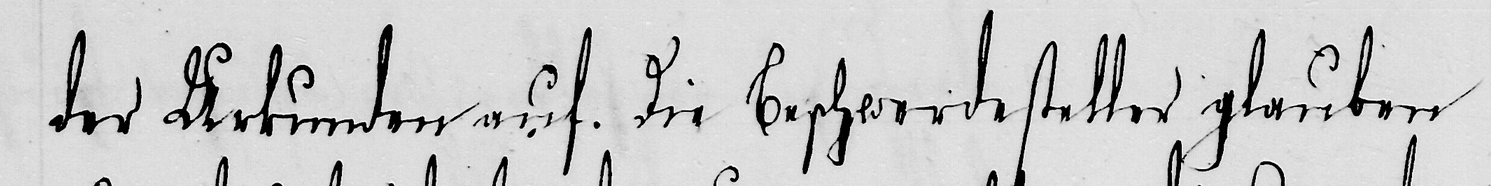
der Urkunden auf. Die Beschwerdesteller glauben
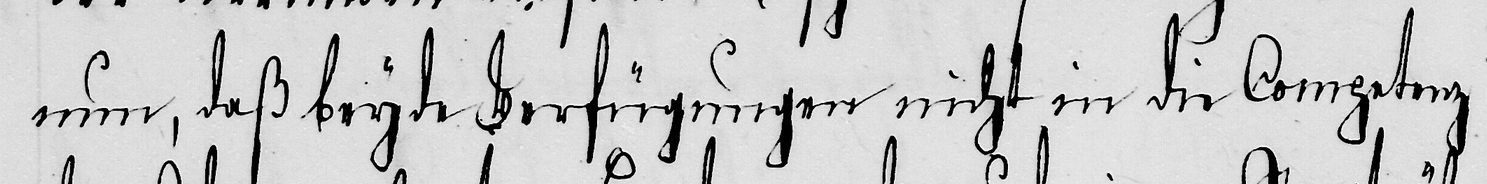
nun, daß beyde Verfügungen nicht in die Competenz
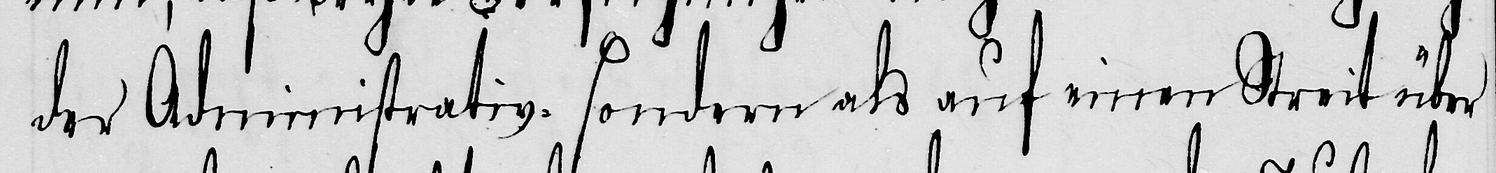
der Administrativ- sondern als auf einen Streit über
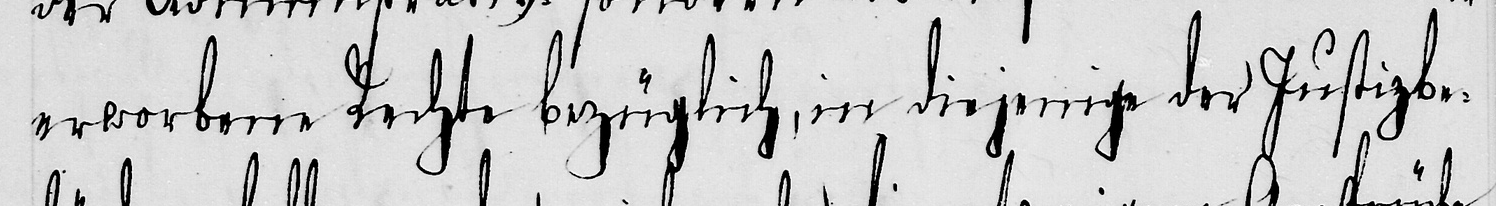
erworbene Rechte bezüglich, in diejenige der Justizbe¬
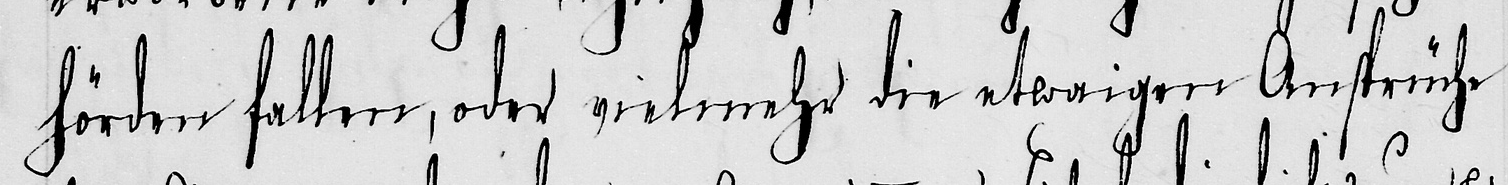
hörden fallen, oder vielmehr die etwaigen Ansprüche
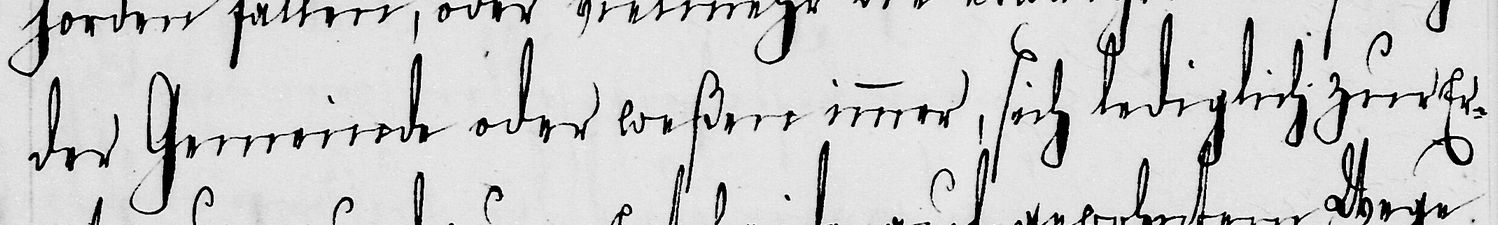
der Gemeinde oder weßen immer, sich lediglich zur Er¬
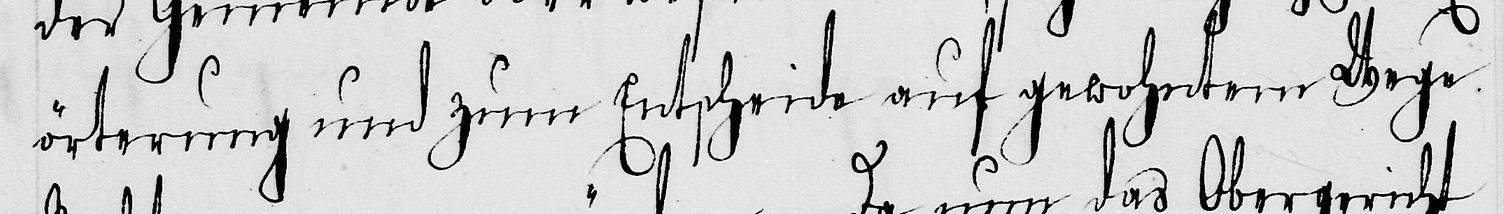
örterung und zum Entscheide auf gewohntem Wege
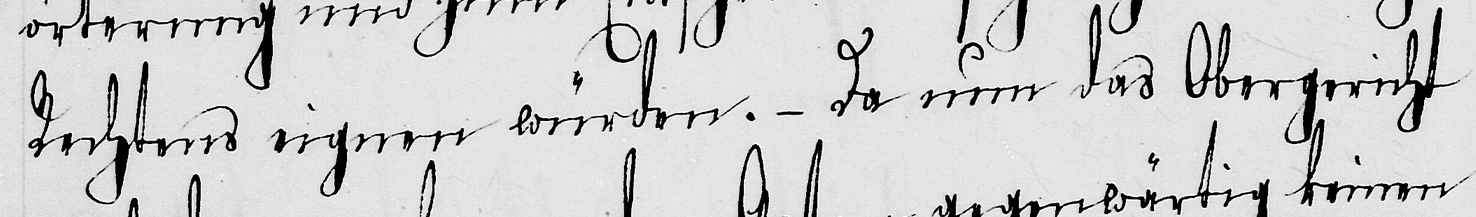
Rechtens eignen würden. – Da nun das Obergericht
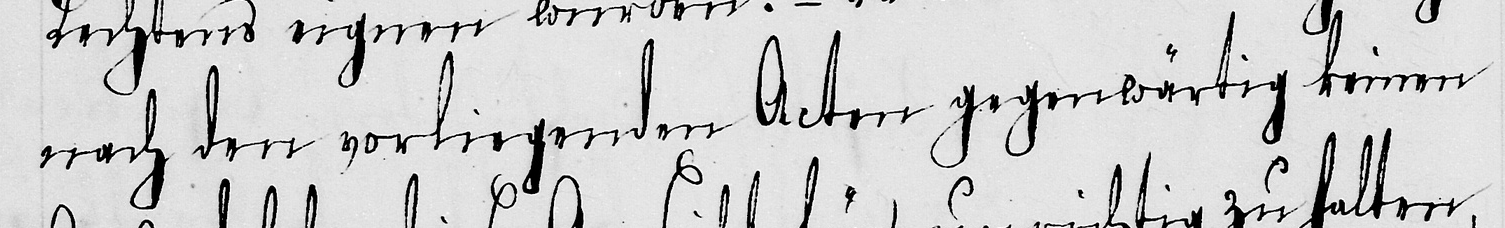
nach den vorliegenden Acten gegenwärtig keinen
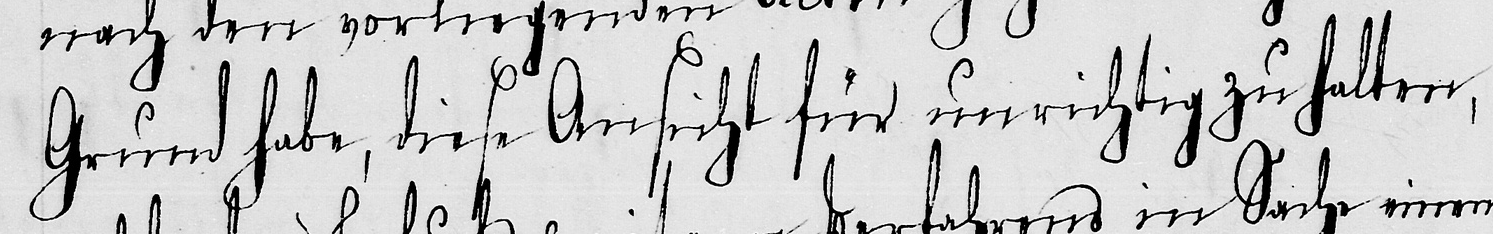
Grund habe, diese Ansicht für unrichtig zu halten,
